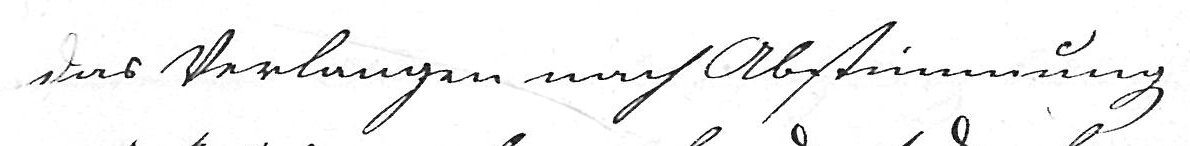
das Verlangen nach Abstimmung
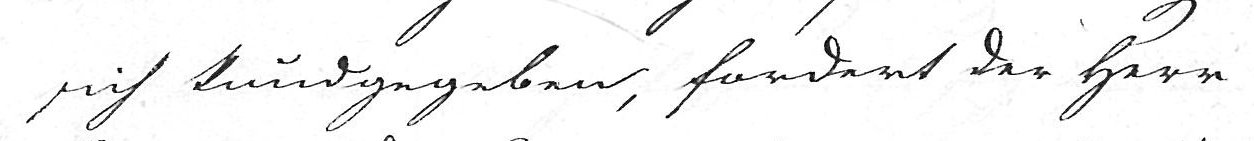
sich kundgegeben, fordert der Herr
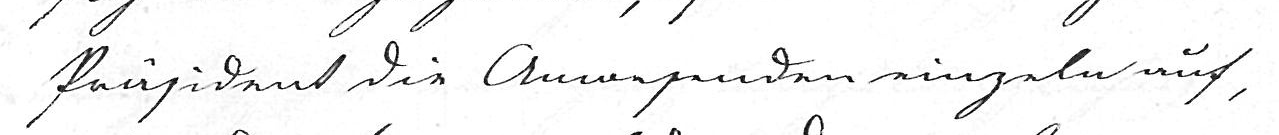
Präsident die Anwesenden einzeln auf,
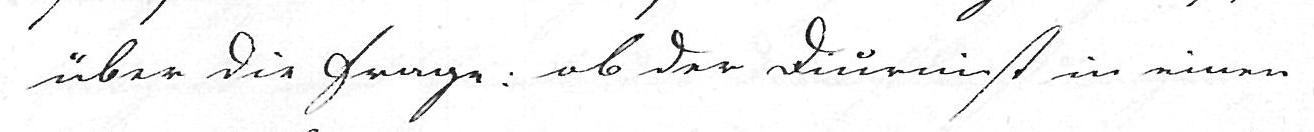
über die Frage: ob der Diurnist in einen
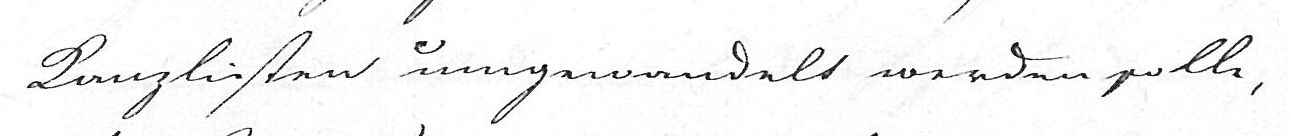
Kanzlisten umgewandelt werden solle,
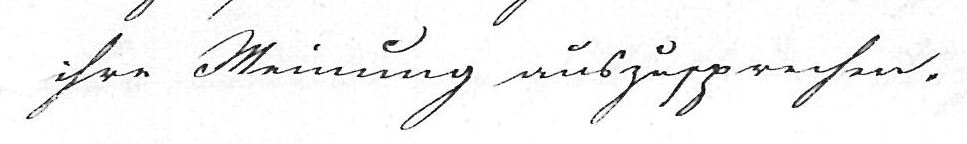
ihre Meinung ausgesprochen.
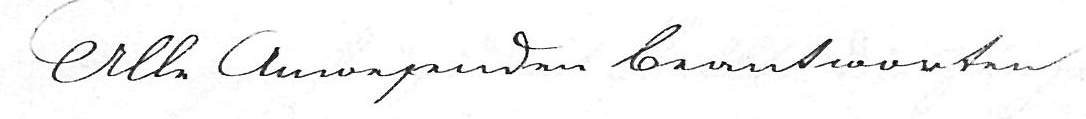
Alle Anwesenden beantworten
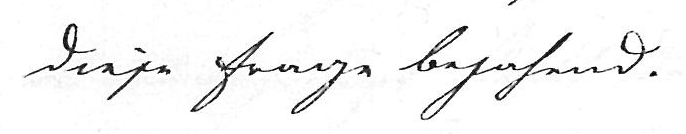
diese Frage bejahend.
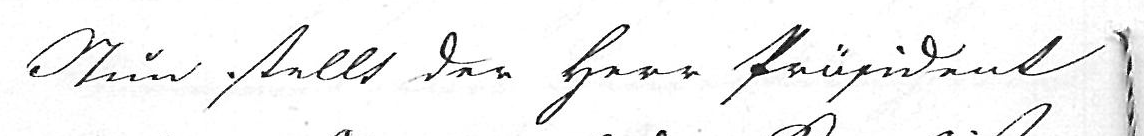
Nun stellt der Herr Präsident
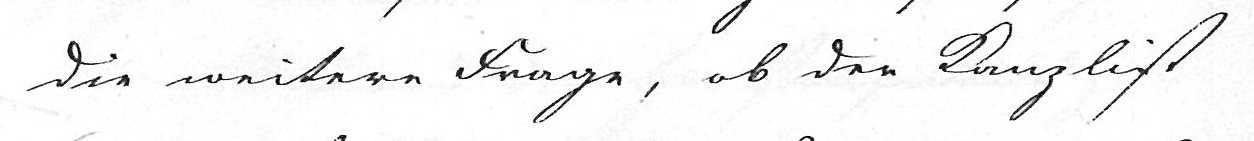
die weitere Frage, ob der Kanzlist
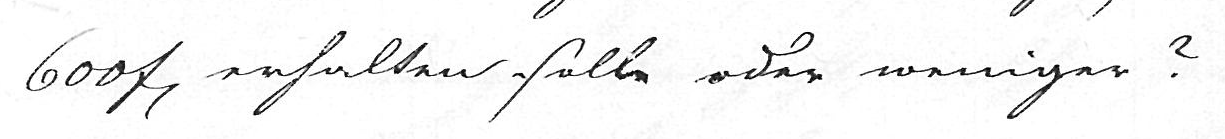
600 fl erhalten solle oder weniger?
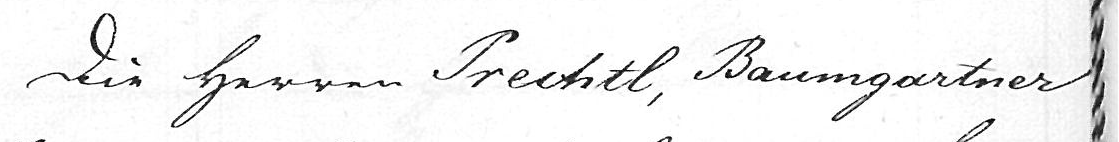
Die Herren Prechtl, Baumgartner
